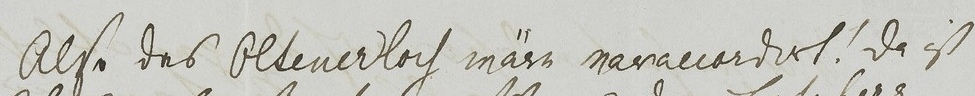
Also das Oltenerloch wäre veraccordirt! Da ist
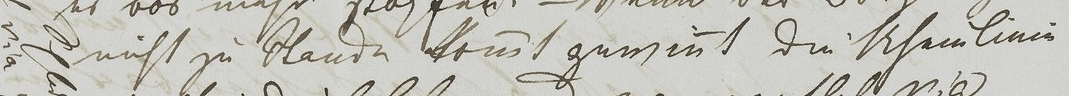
nicht zu Stande kommt gewinnt die Rheinlinie
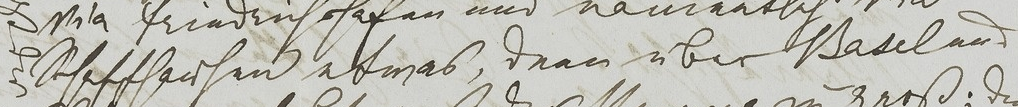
Schaffhausen etwas, denn über Basel und
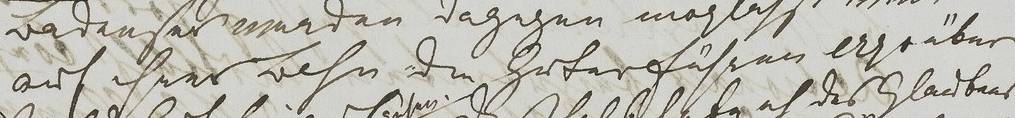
auf ihrer Bahn die Güter führen ergo über
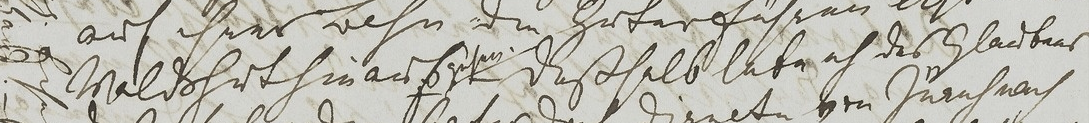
Waldshut hinaus gehen. – Deßhalb lebe ich des Glaubens
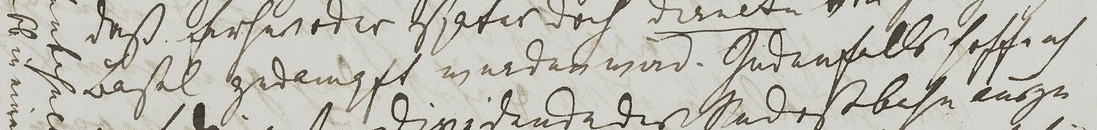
Basel gedampft werden wird. Jedenfalls hoffe ich
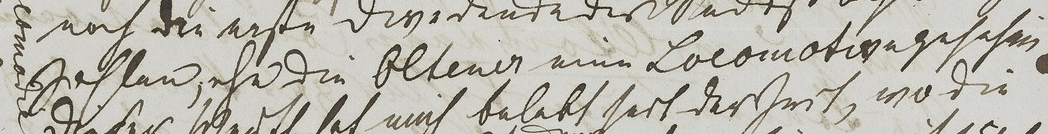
zahlen, ehe die Oltener eine Locomotive gesehen.
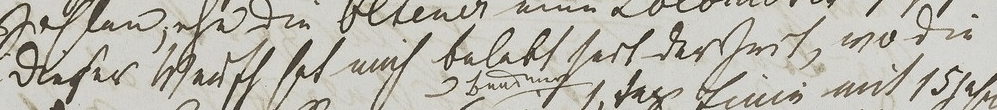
Dieser Wunsch hat mich belebt seit der Zeit, wo die
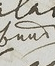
eidgen.
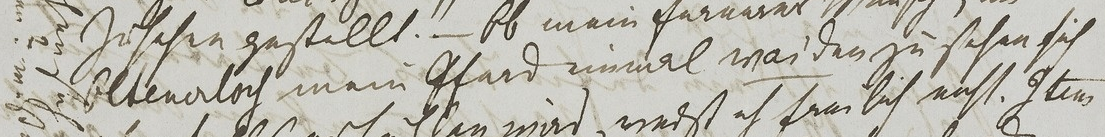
Oltenerloch mein Pferd einmal weiden zu sehen sich
